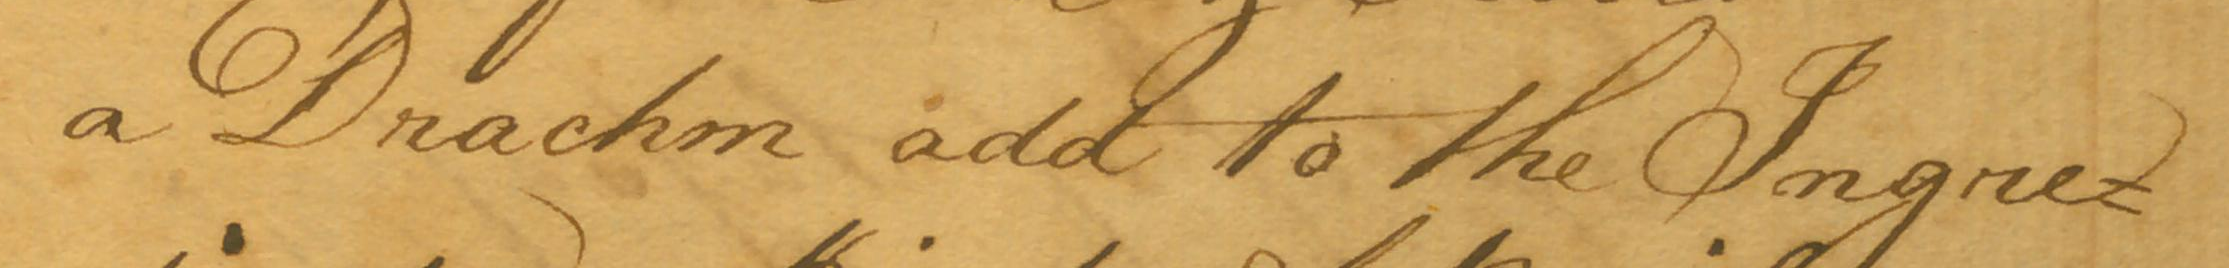a Drachm add to the Ingre-
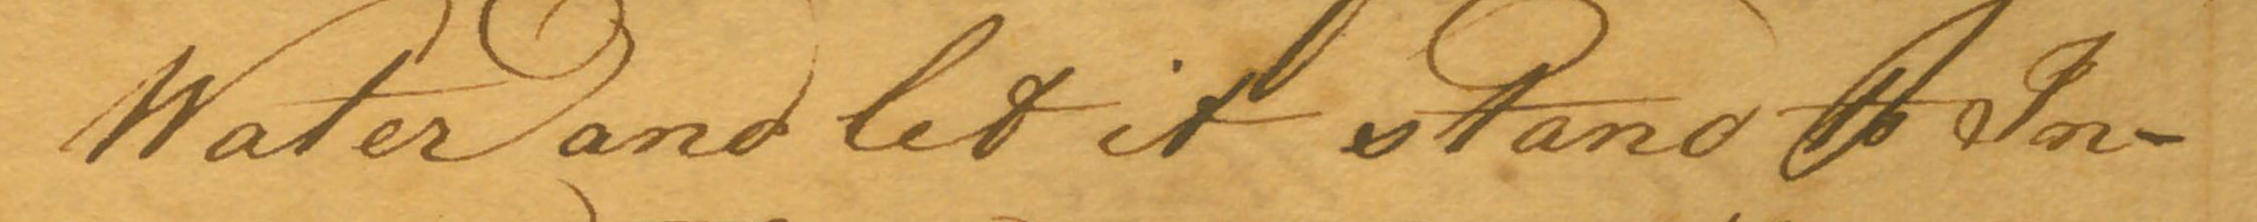Water and let it stand to In-
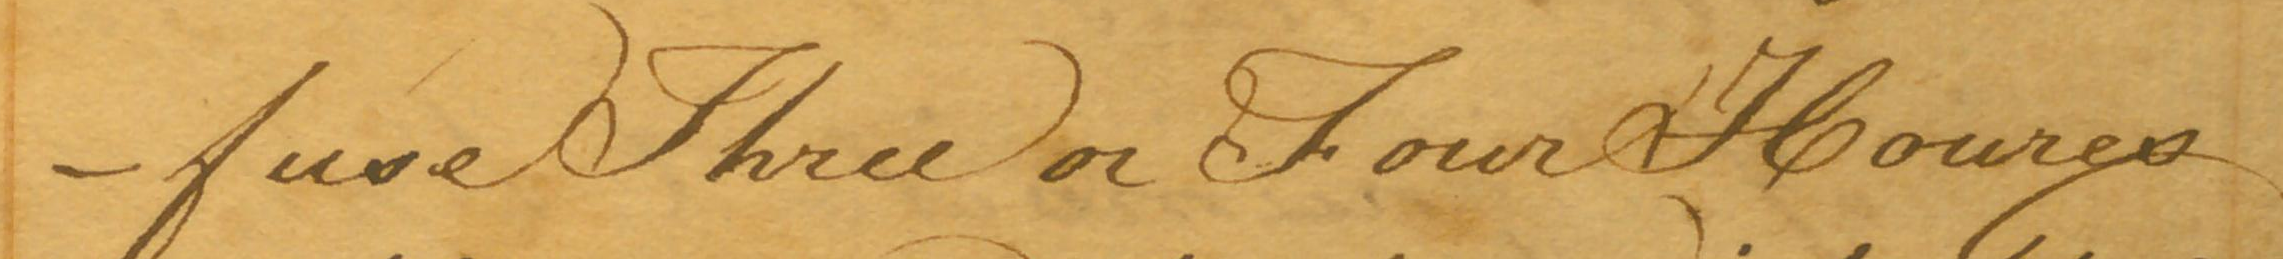-fuse Three or Four Houres
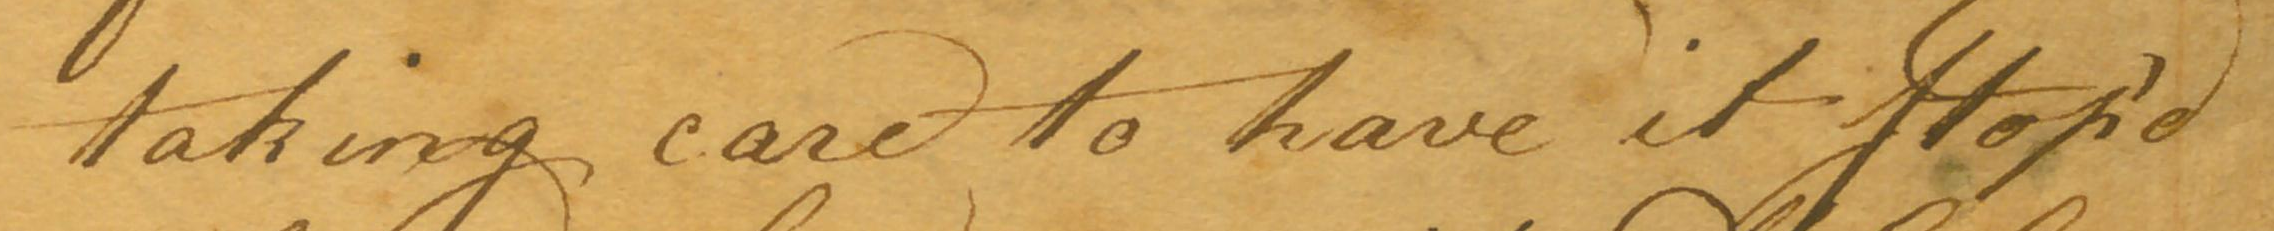taking care to have it stop'd
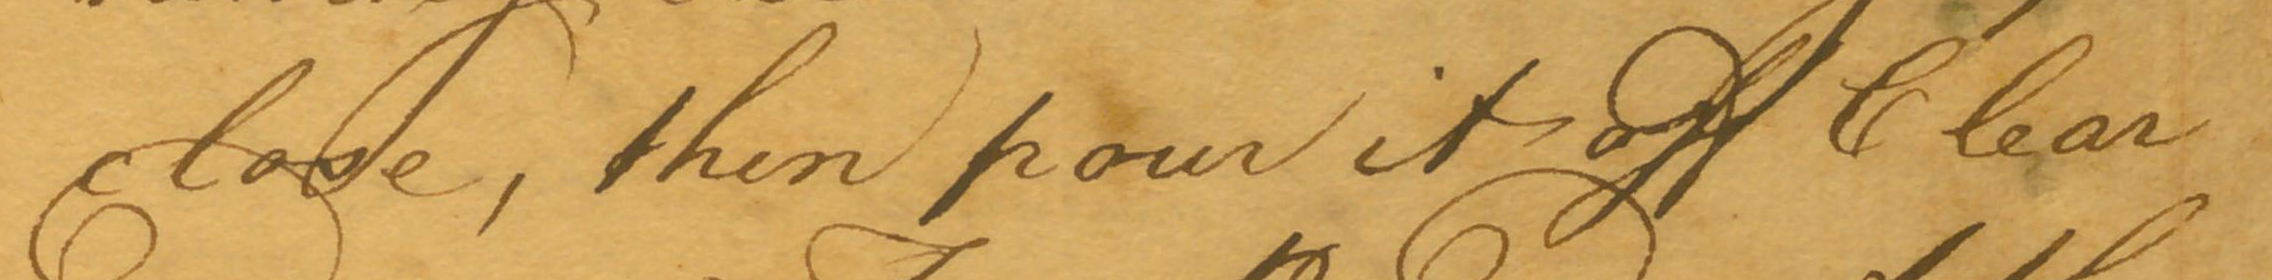close, then pour it off Clear
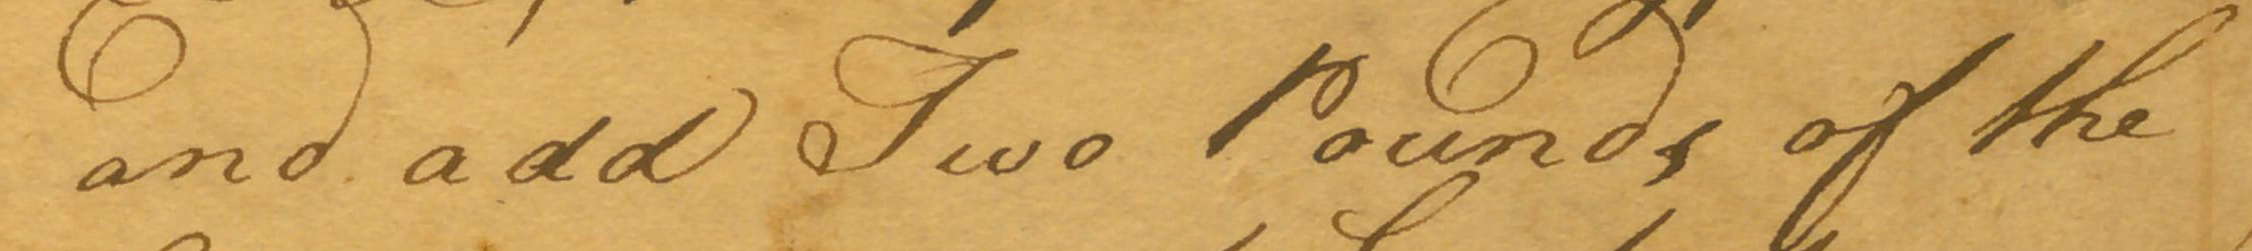and add Two Pounds of the
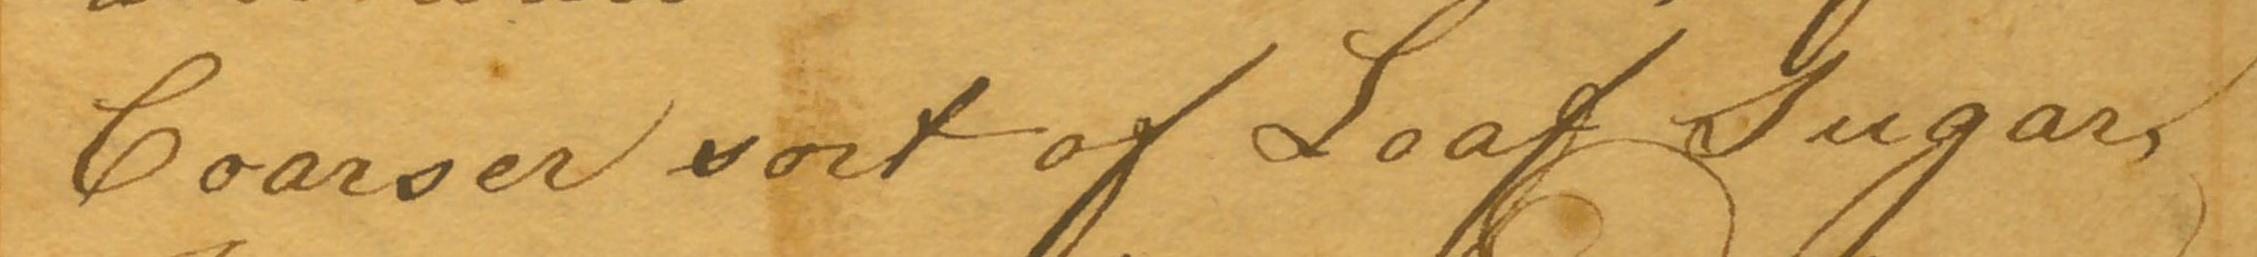Coarser sort of Loaf sugar,
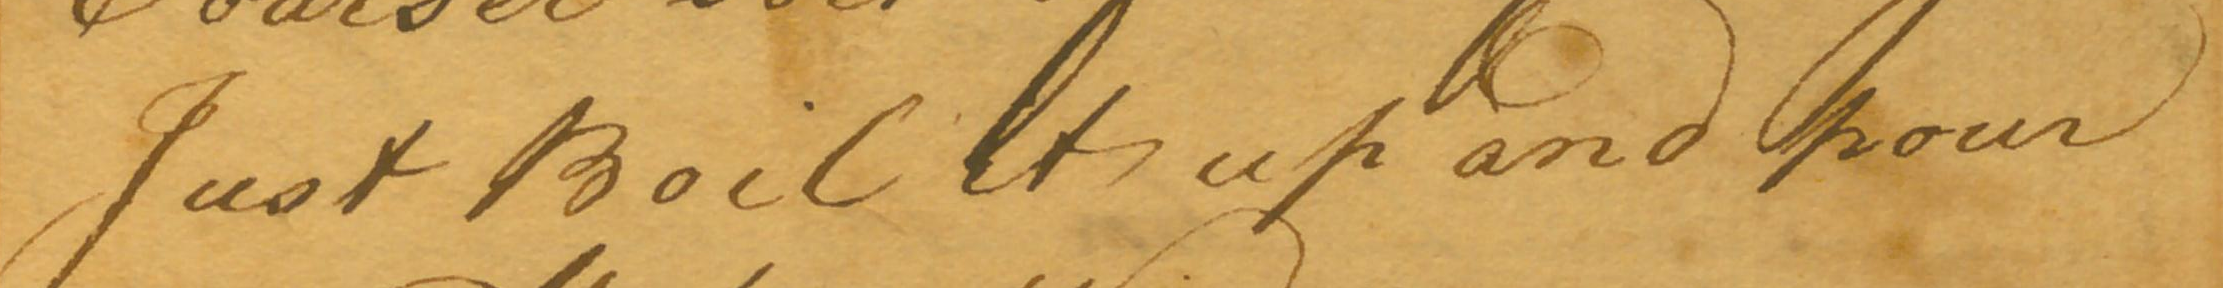Just Boil it up and pour
